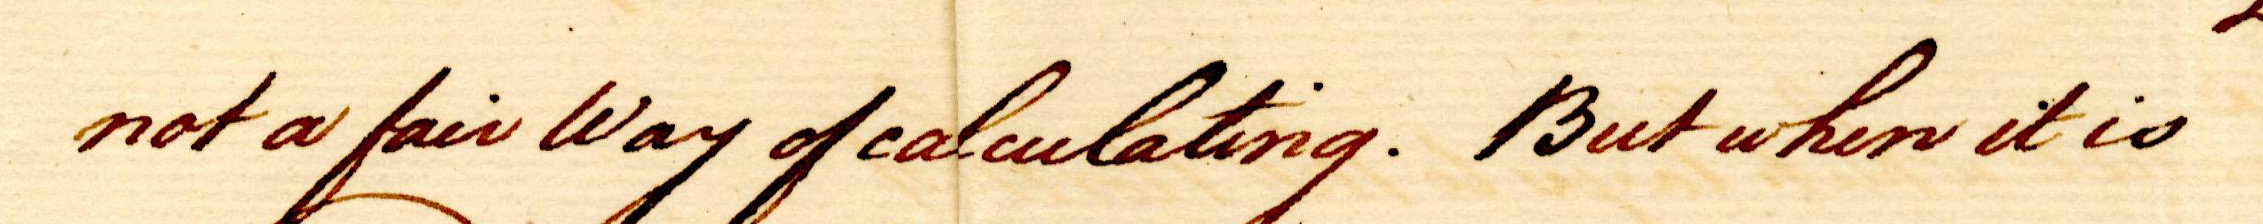not a fair Way of calculating. But when it is
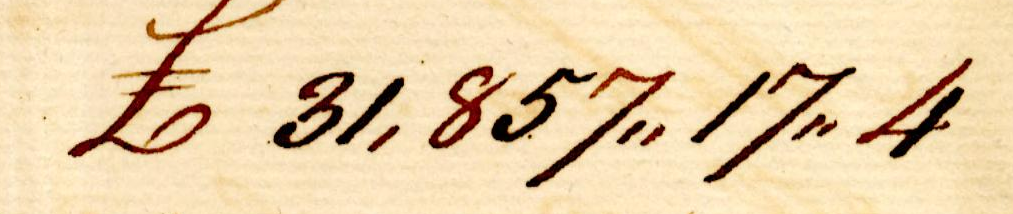£31,857.17.4
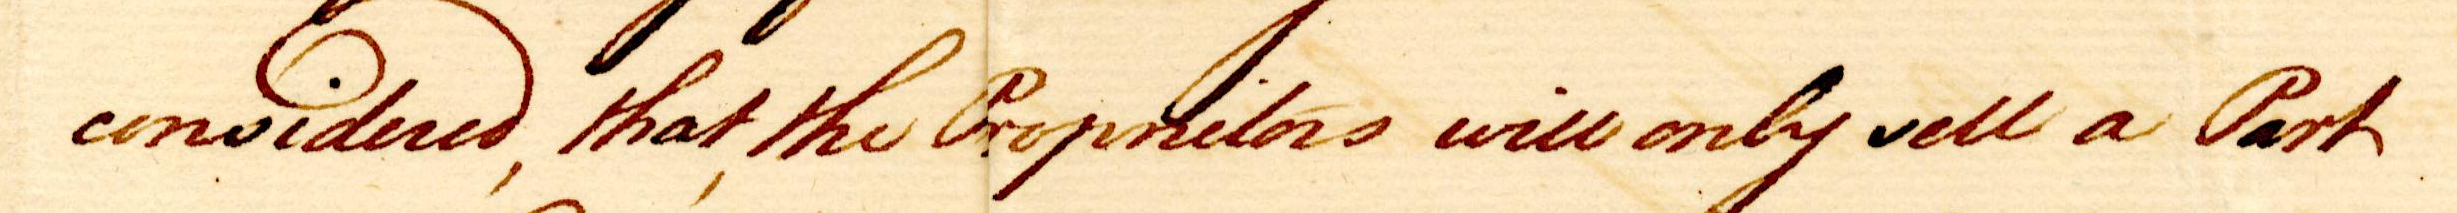considered that the Proprietors will only sell a Part
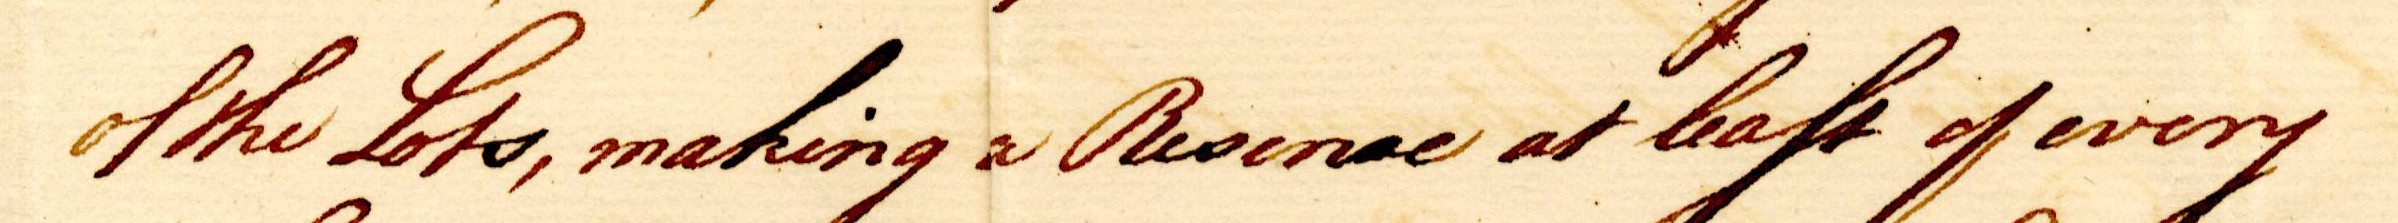of the Lots, making a Resale at least of every
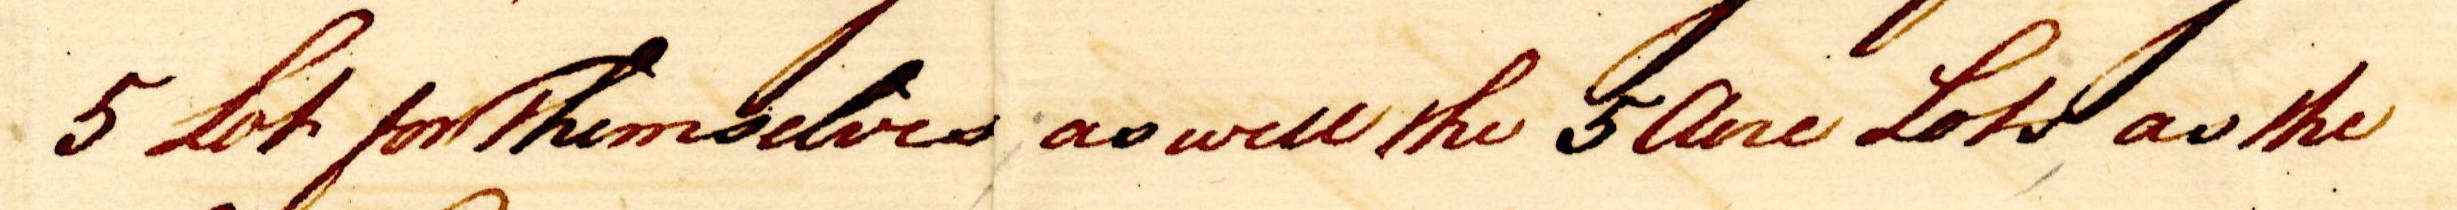5 Lot for themselves as well the 5 Acre Lots as the
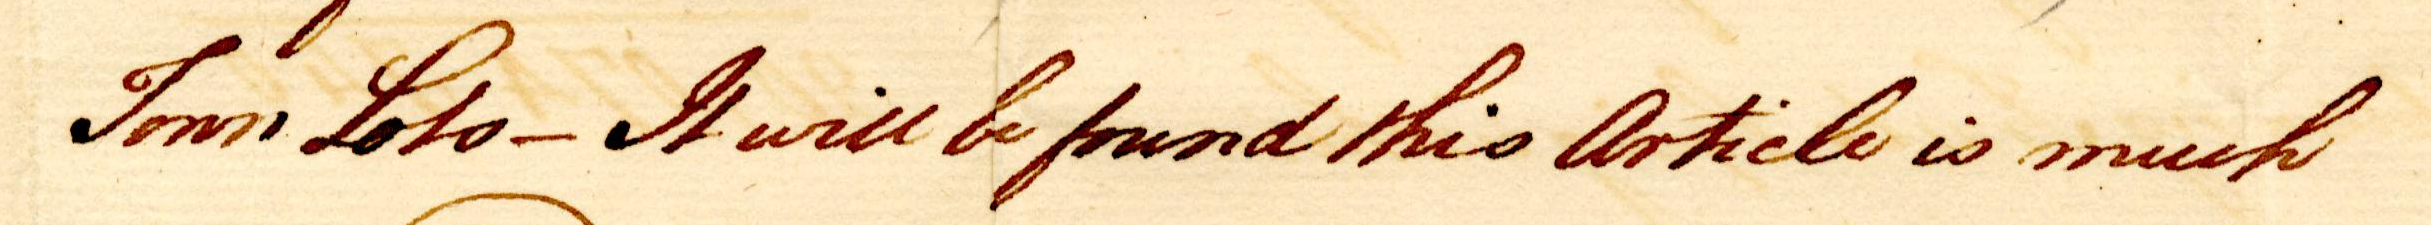Town Lots- It will be found this Article is much
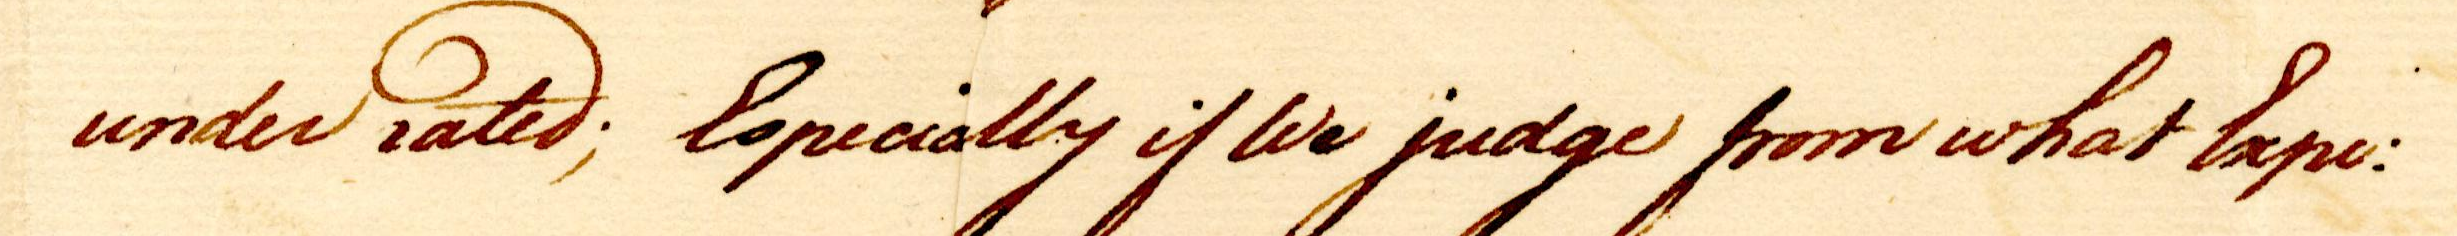under rated; Especially if we judge from what Expe-
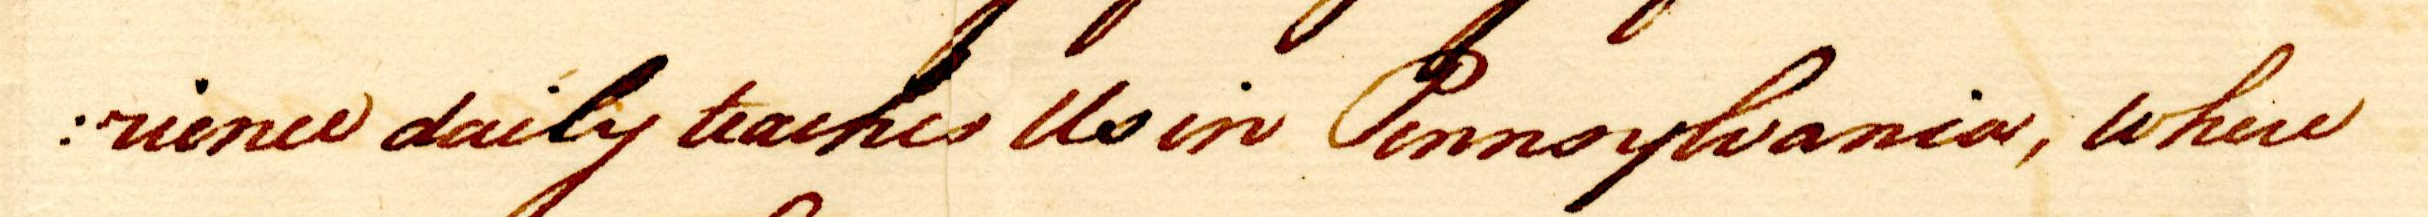-rience daily teaches Us in Pennsylvania, where
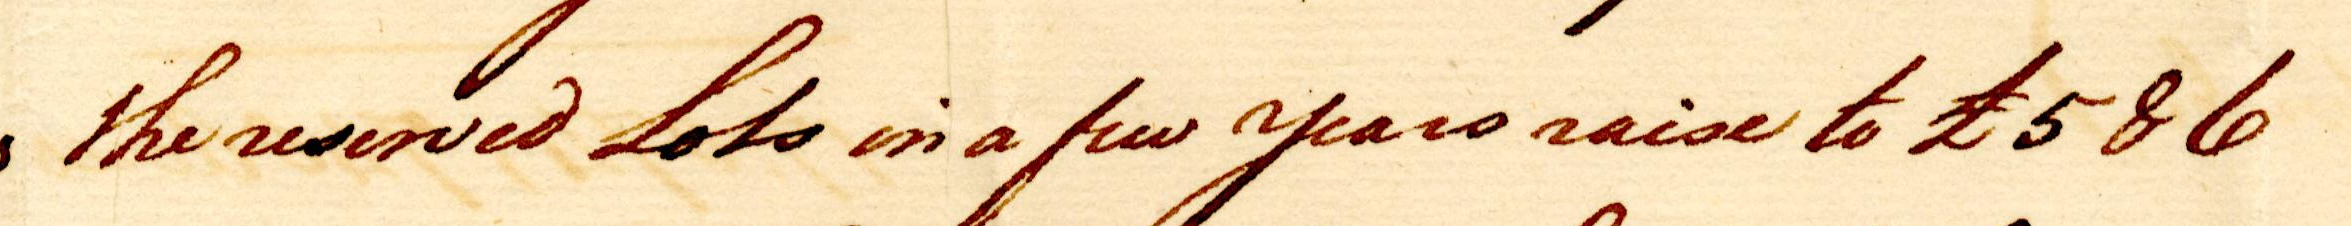the reserved Lots in a few years raise to £586
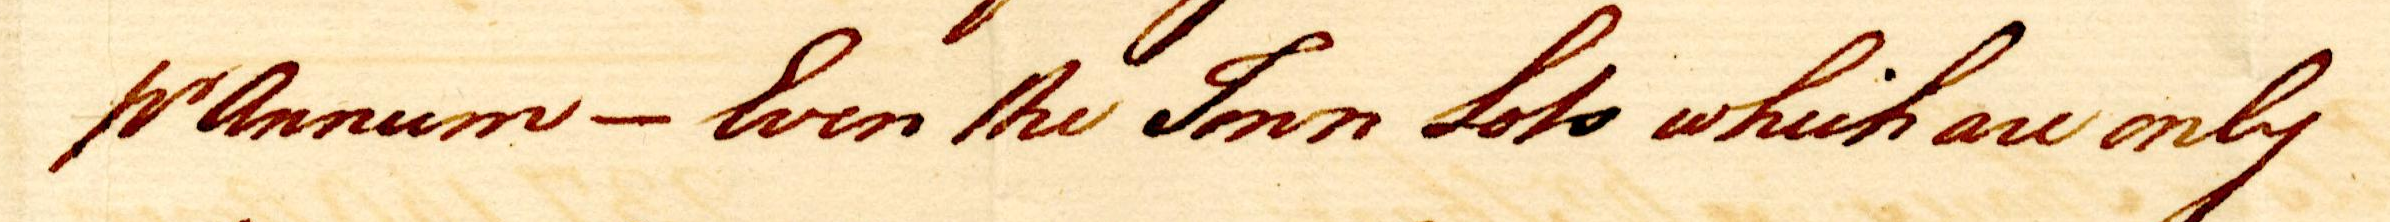p^r Annum- Even the Town lots which are only
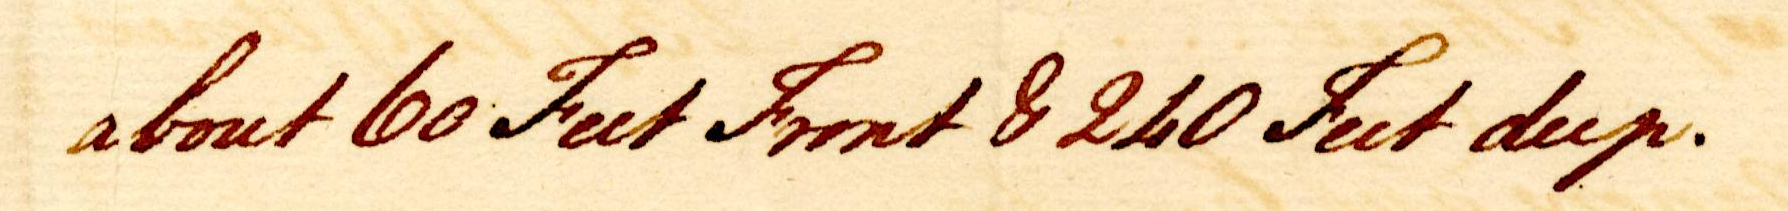about 60 Feet Front & 240 Feet deep.
